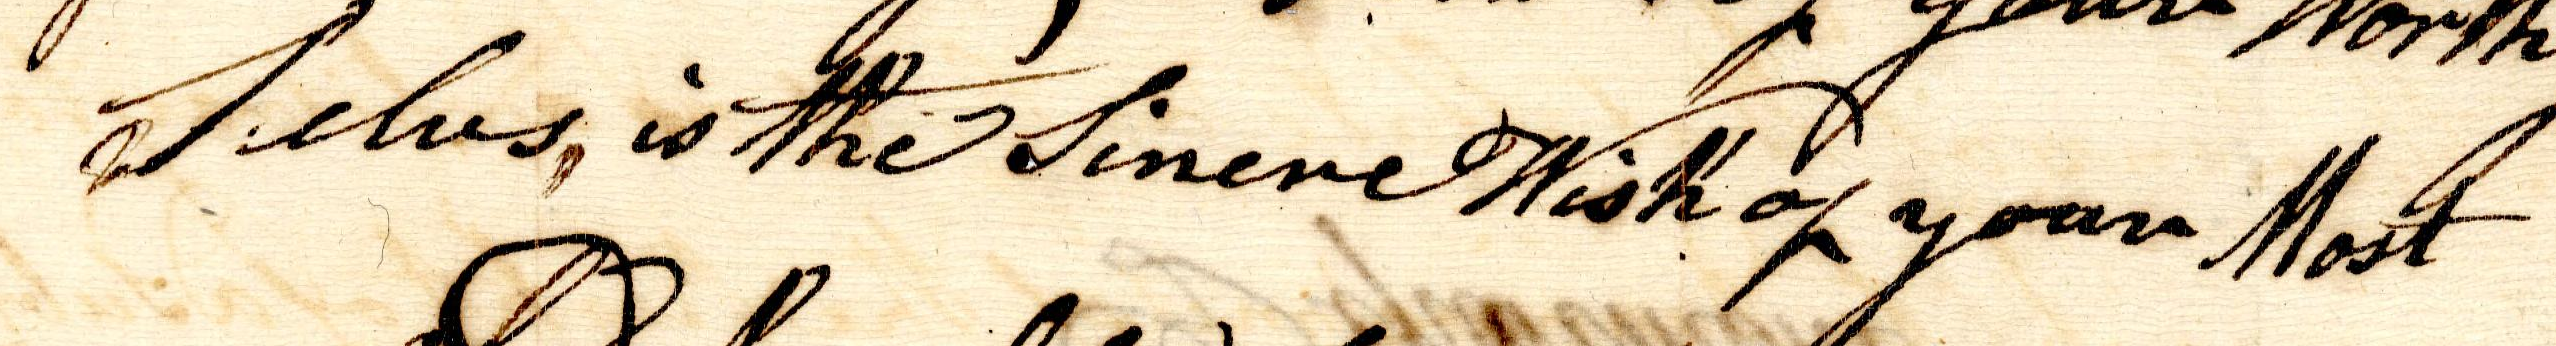Selvs, is the Sinere Wish of your Most
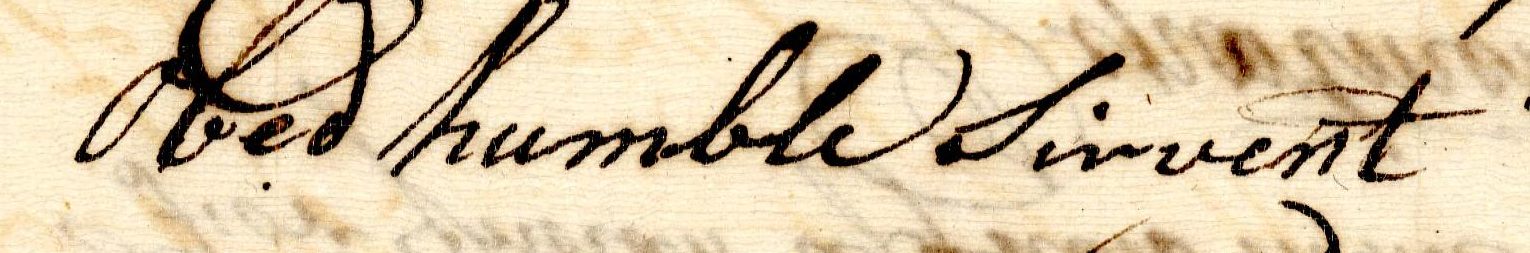Obed humble Sirvent
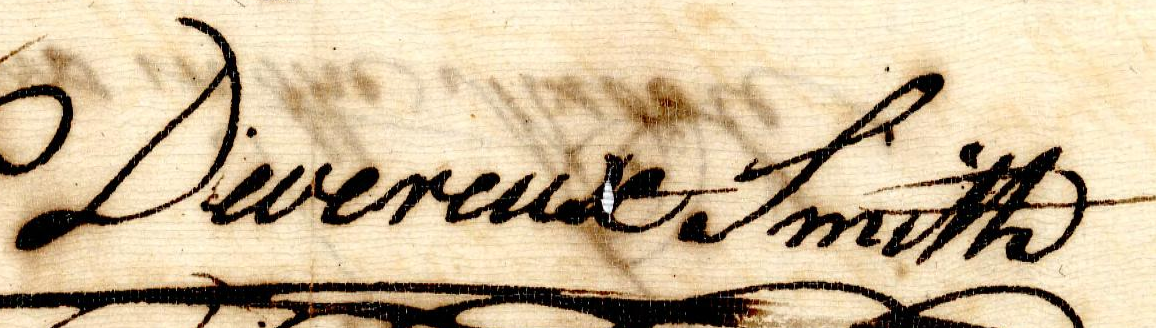Devereux Smith
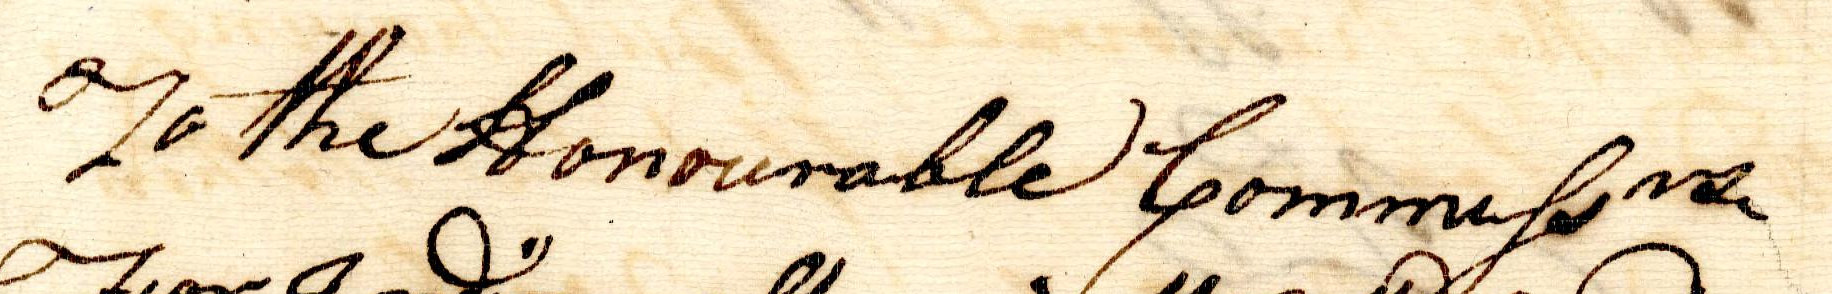To the Honourable Commiss^rs
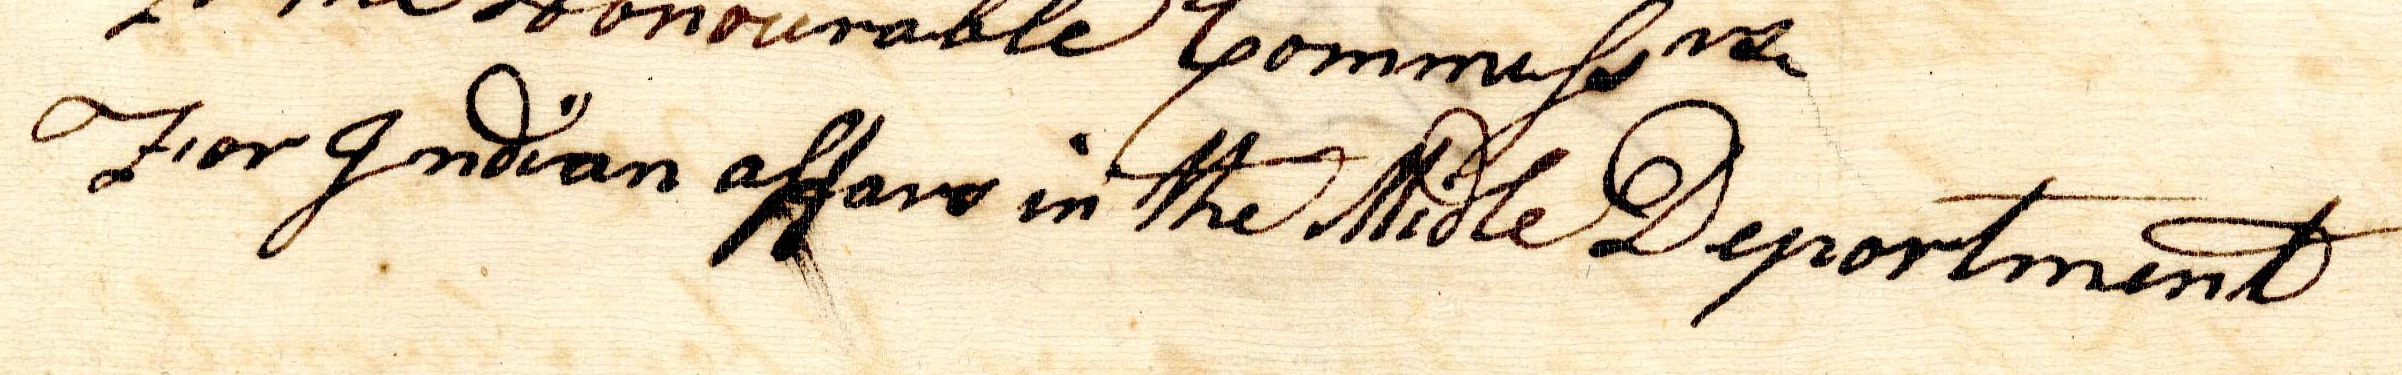For Indian affars in the Midle Deportment
